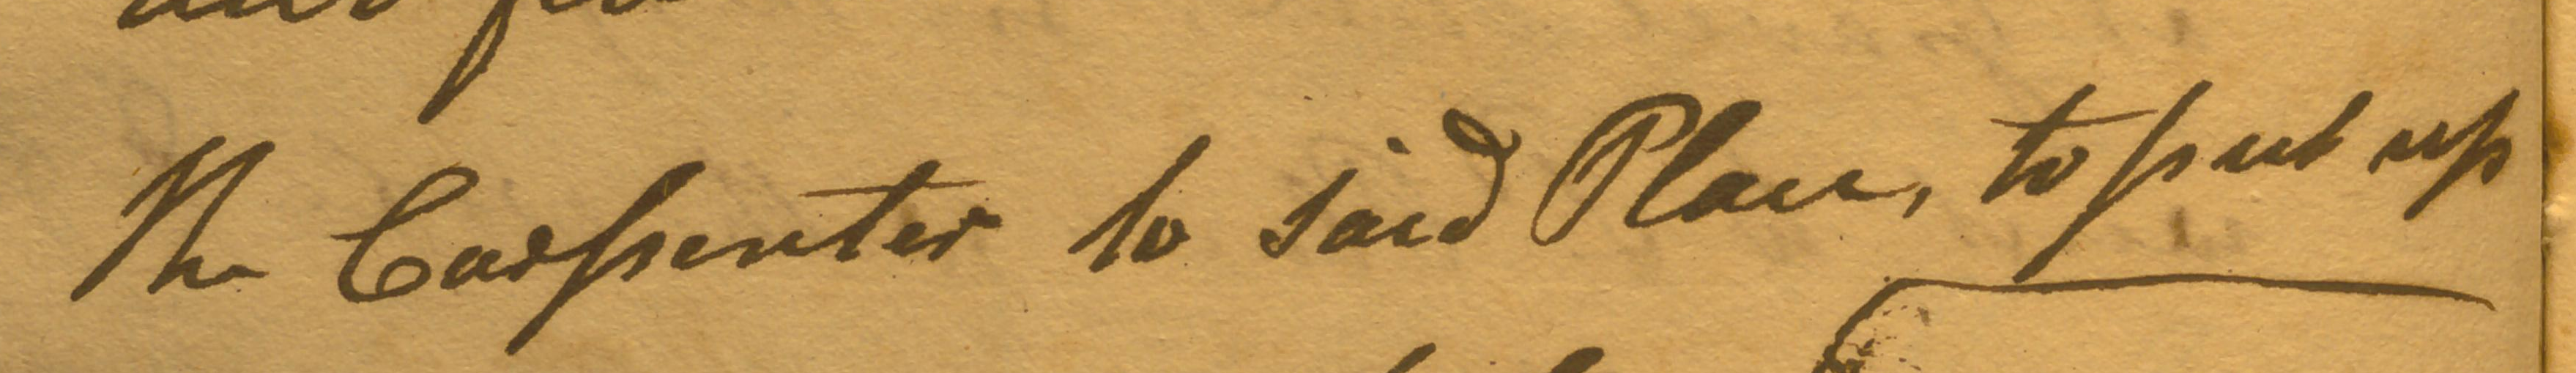The Carpenter to said Place, to put up
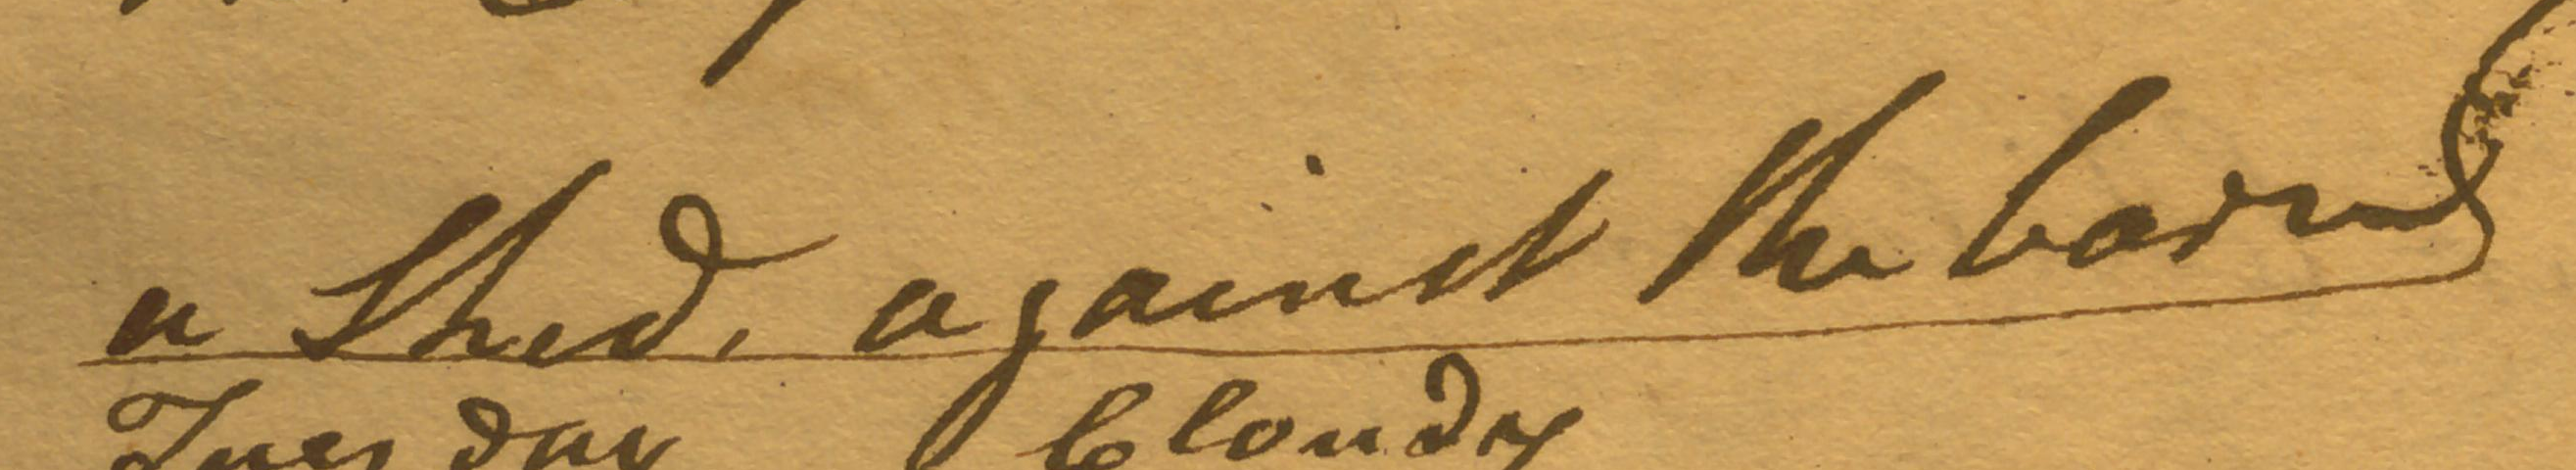a Shed, against the barn
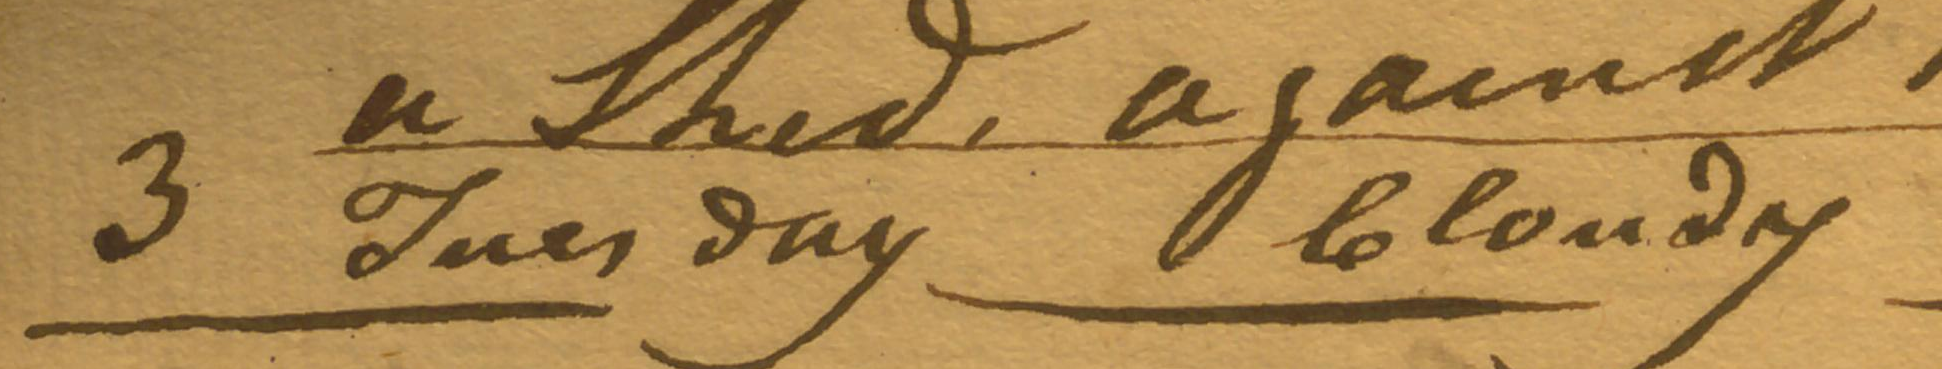3 Tuesday Cloudy
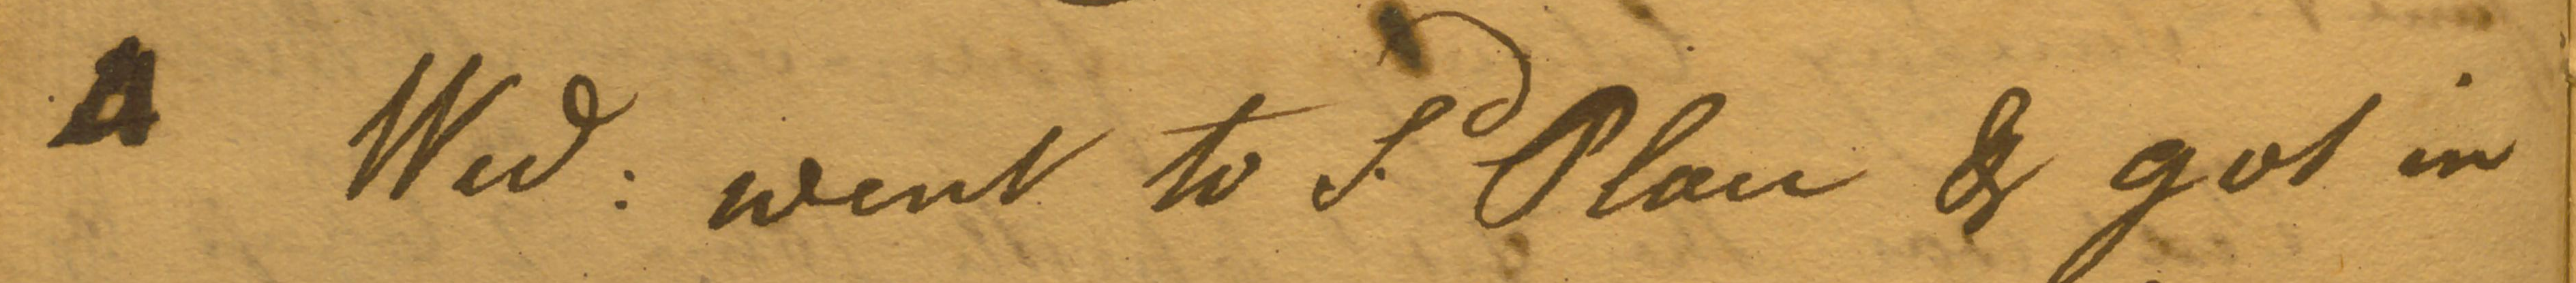4 Wed. went to S^d. Place & got in
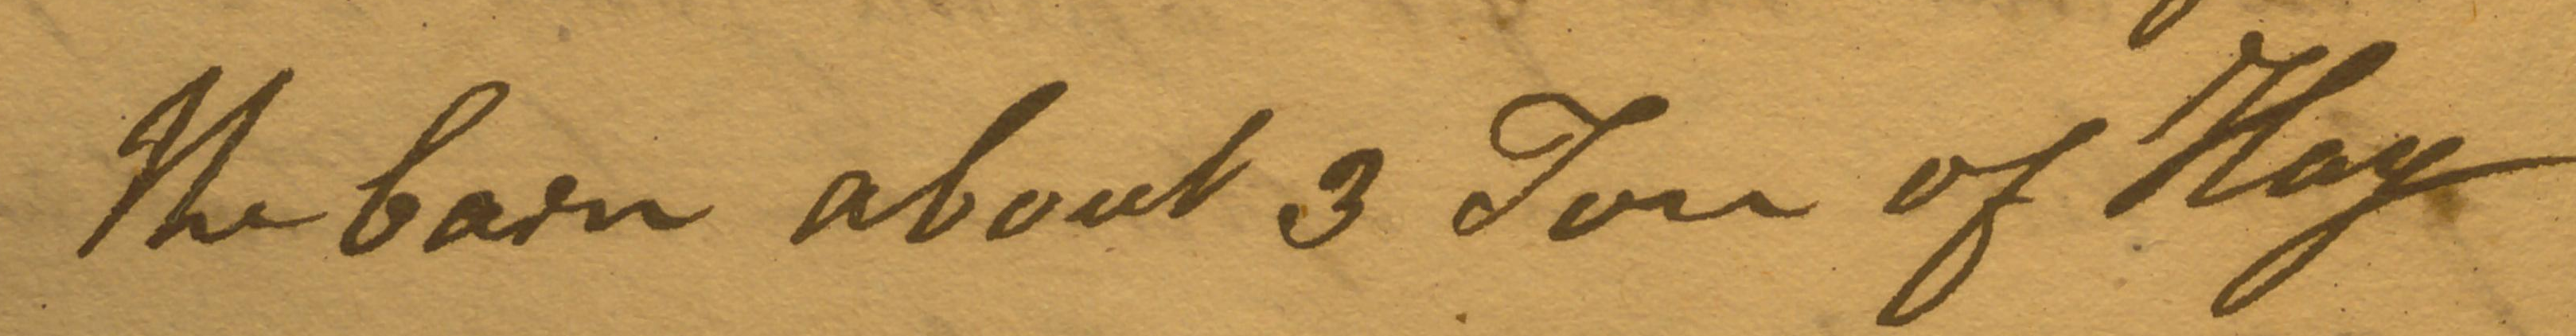the barn about 3 Ton of Hay
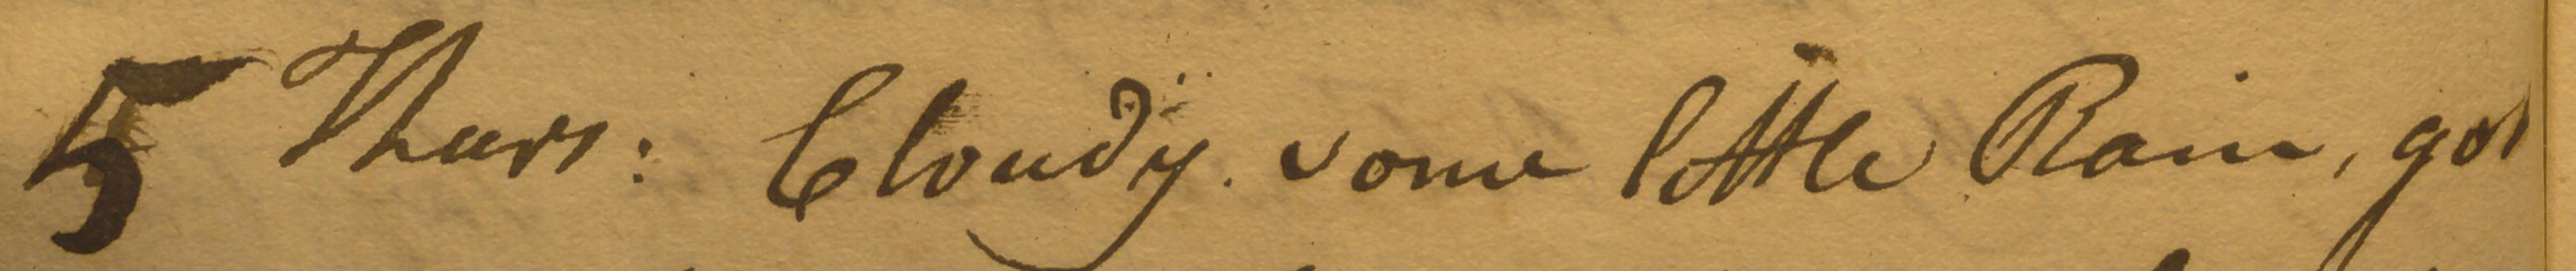5 Thurs: Cloudy. some little Rain, got
